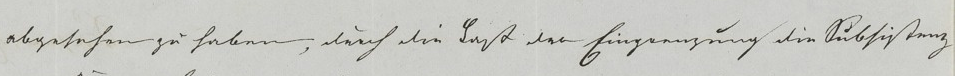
abgesehen zu haben, durch die Last der Eingrenzung die Subsistenz
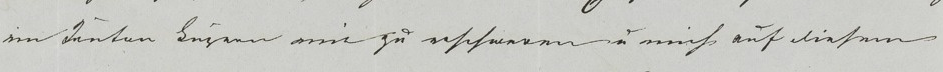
im Kanton Luzern mir zu erschweren u mich auf diesem
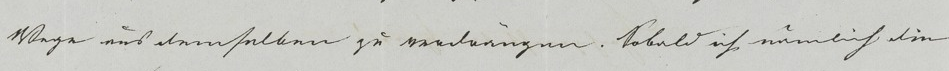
Wege aus demselben zu verdrängen. Sobald ich nämlich die
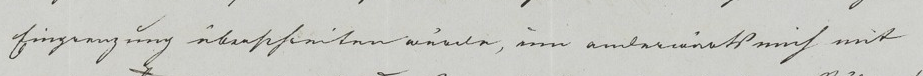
Eingrenzung überschreiten würde, um anderwärts mich mit
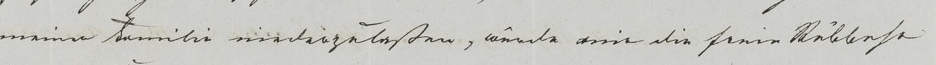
meiner Familie niederzulaßen, würde mir die freie Rükkehr
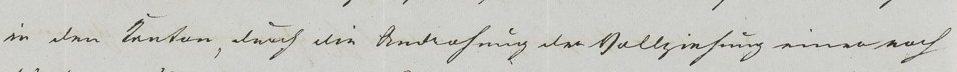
in den Kanton, durch die Androhung der Vollziehung einer noch
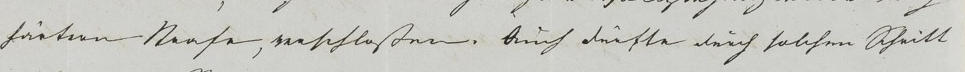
härtern Strafe, verschloßen. Auch dürfte durch solchen Schritt
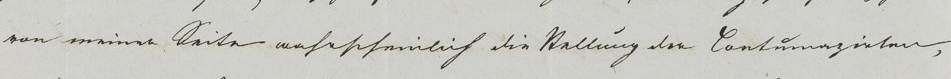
von meiner Seite wahrscheinlich die Stellung der Contumazirten,
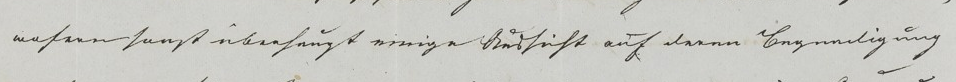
wofern sonst überhaupt einige Aussicht auf deren Begnadigung
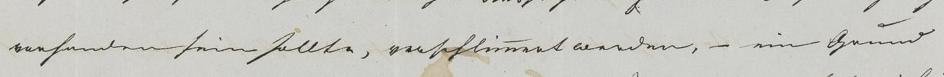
vorhanden sein sollte, verschlimmert werden, – ein Grund
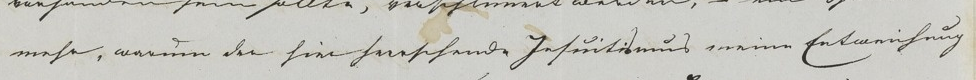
mehr, warum der hier herrschende Jesuitismus meine Entweichung
